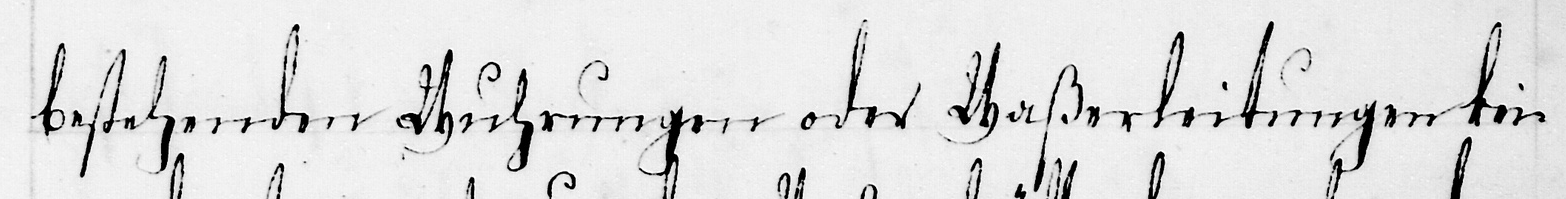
bestehenden Wuhrungen oder Waßerleitungen kei¬
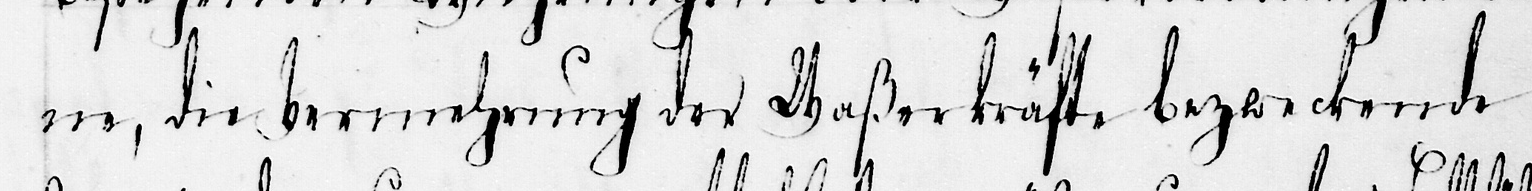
ne, die Vermehrung der Waßerkräfte bezweckende
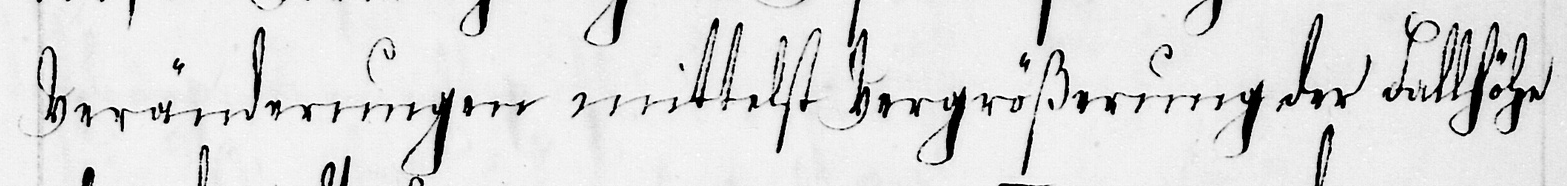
Veränderungen mittelst Vergrößerung der Fallhöhe
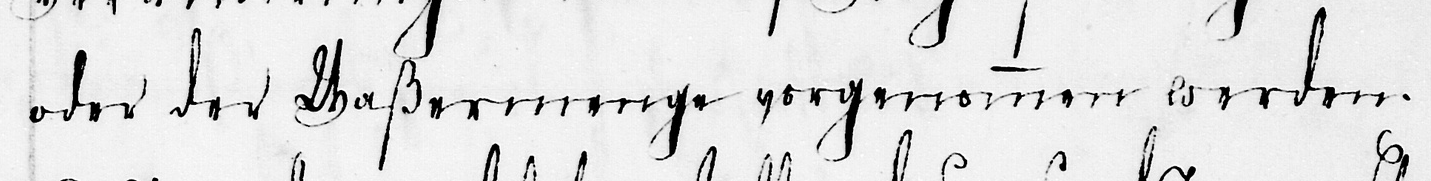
oder der Waßermenge vorgenommen werden.
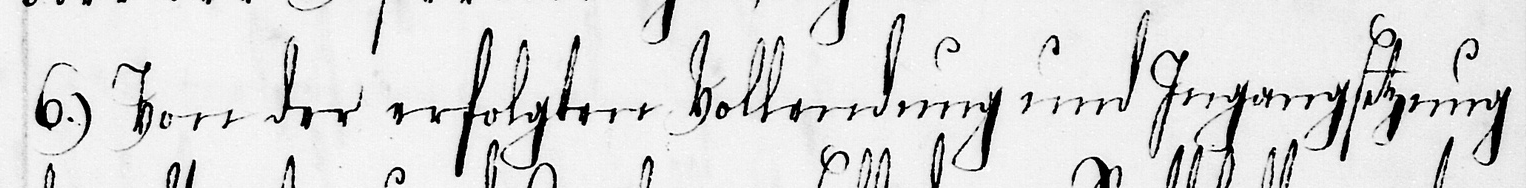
6.) Von der erfolgten Vollendung und Ingangsetzung
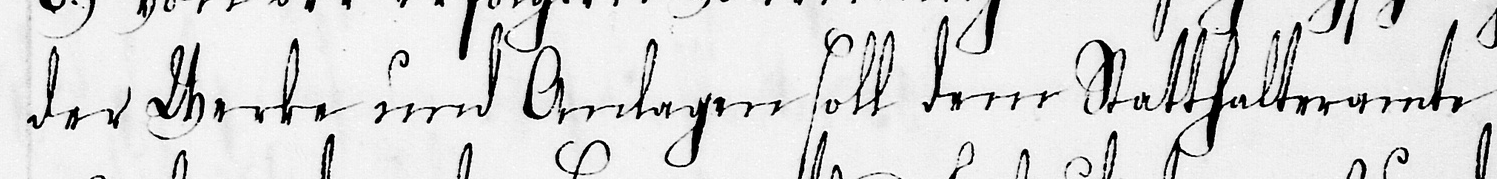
der Werke und Anlagen soll dem Statthalteramte
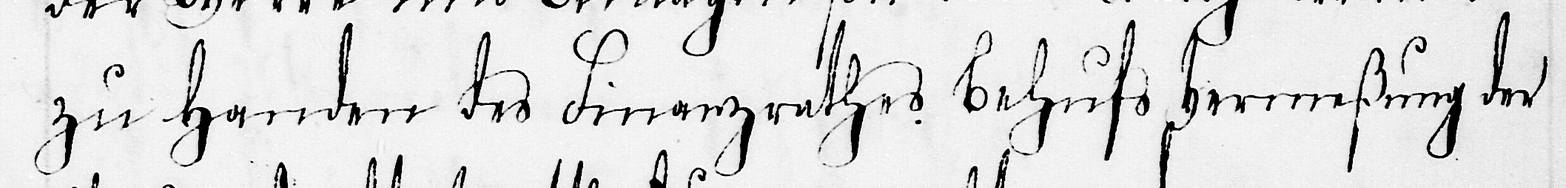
zu Handen des Finanzrathes Behufs Vermeßung der
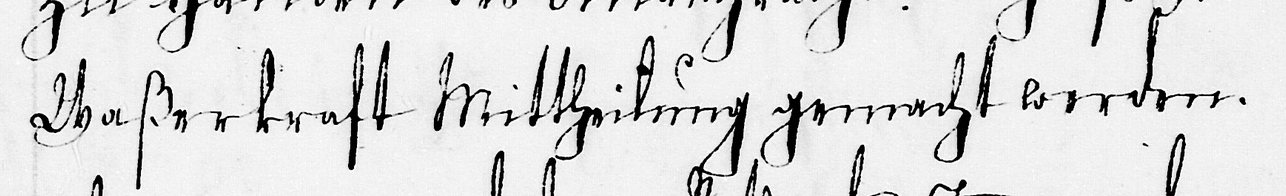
Waßerkraft Mittheilung gemacht werden.
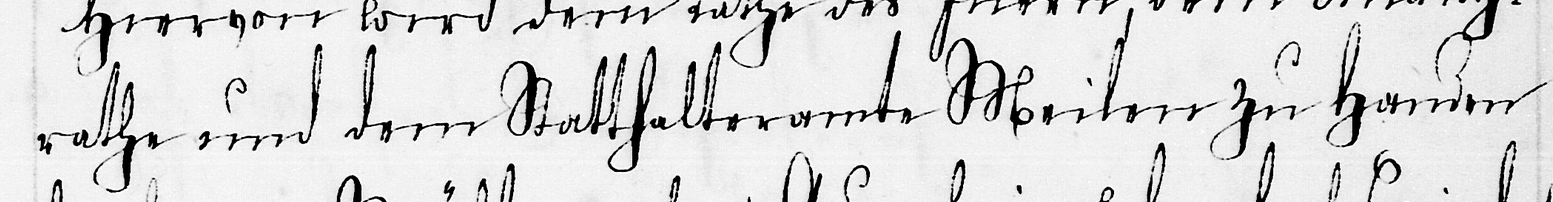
rathe und dem Statthalteramte Meilen zu Handen
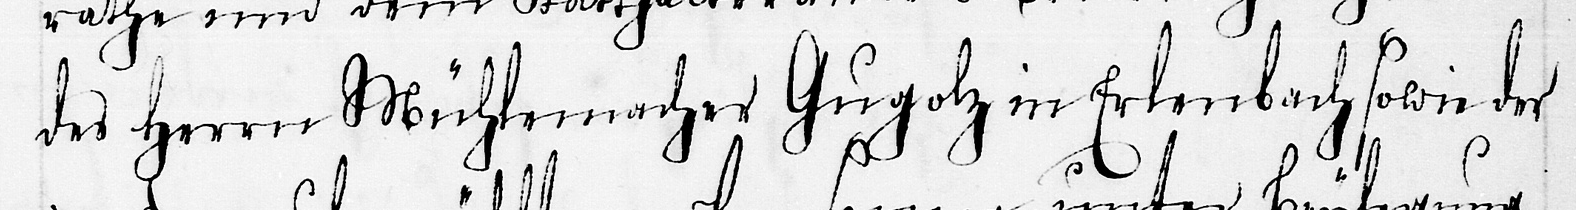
des Herrn Mühlemacher Gugolz in Erlenbach sowie der
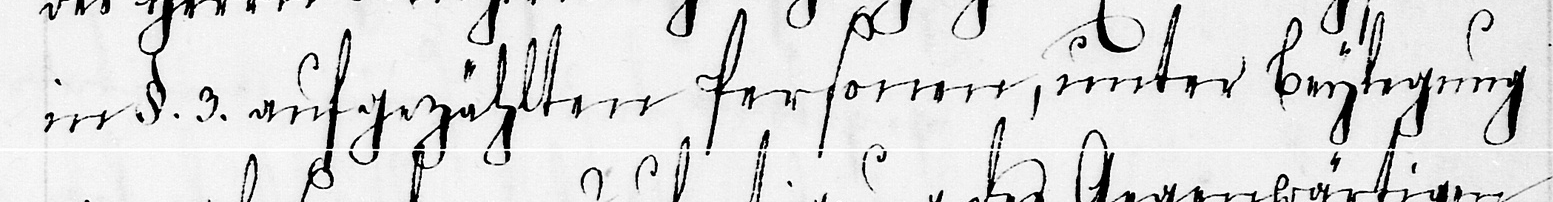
in §. 3. aufgezählten Personen, unter Beylegung
